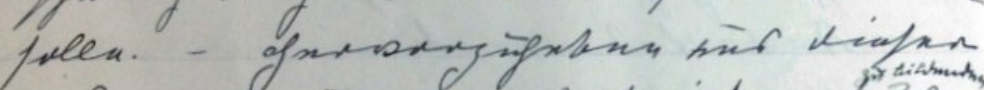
solle - Hervorzuheben zu dieser
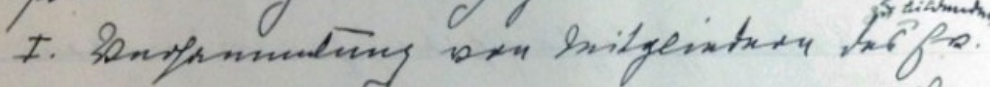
I. Versammlung von Mitgliedern des Ev.
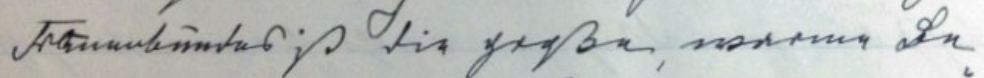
Frauenbundes ist die große, warme Be
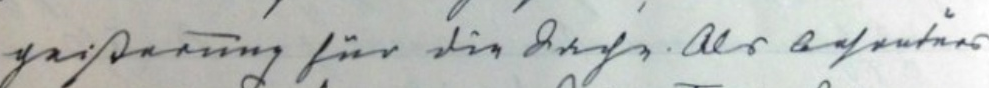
Begeisterung für die Sache. Als besonders
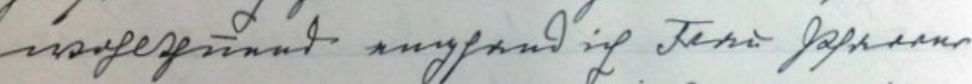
wohlthuend empfand ich Frau Pfarrer
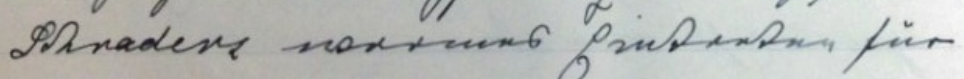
Schraders warmes Eintreten für
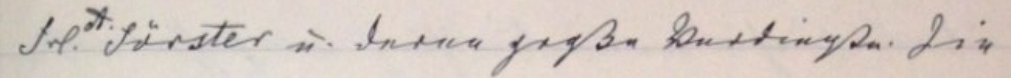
Frl. Förster u. deren große Verdienste. Sie
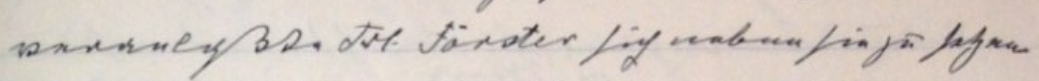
veranlaßte Frl. Förster sich neben sie zu setzten
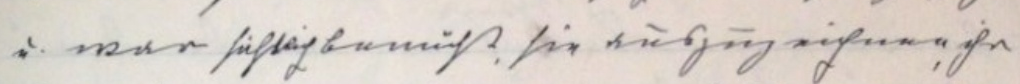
u. war stetig bemüht sie auszuzeichnen ihr
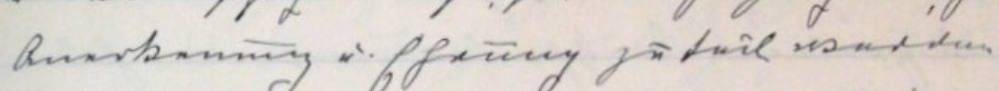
Anerkennung und Ehrung zu teil werden
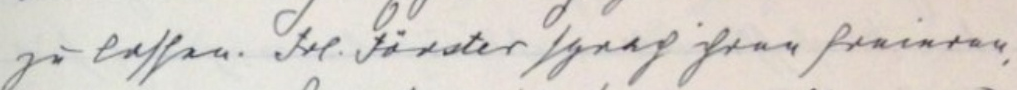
zu lassen. Frl. Förster sprach ihren
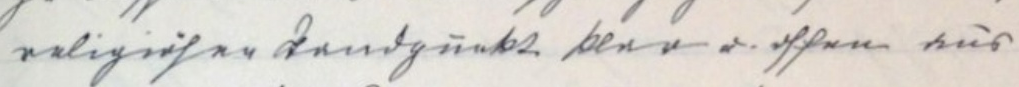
freieren religiösen Standpunkt klar und offen aus
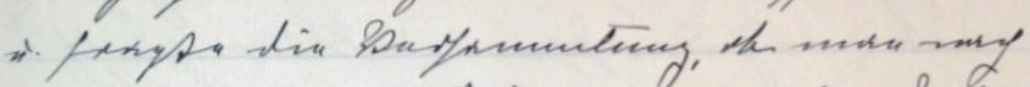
u. fragte die Versammlung ob man nach
